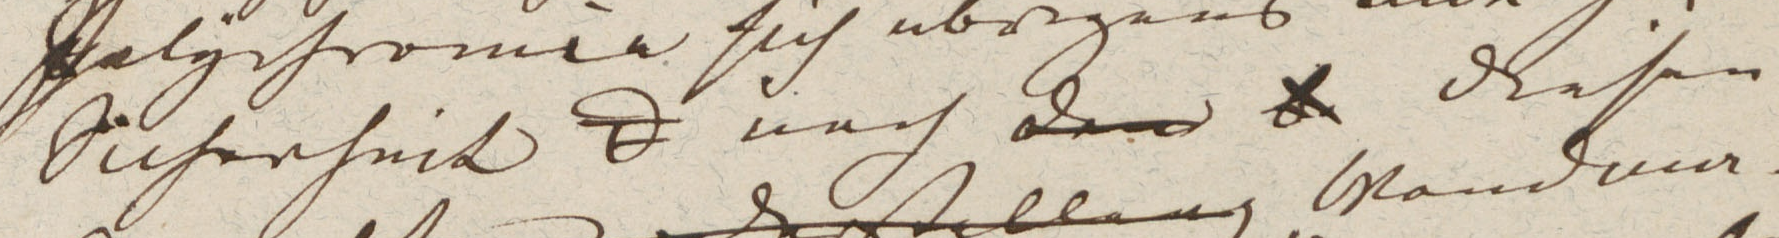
Sicherheit D nach den diesen
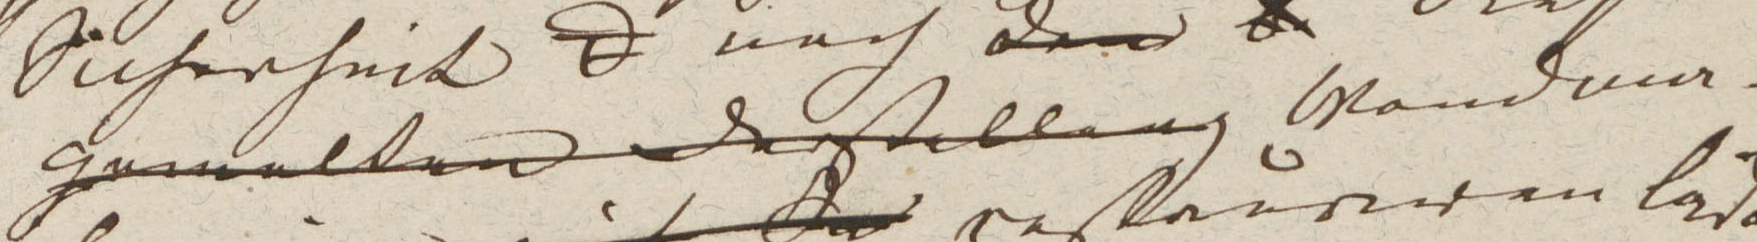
gemalten Darstellung Wandma-
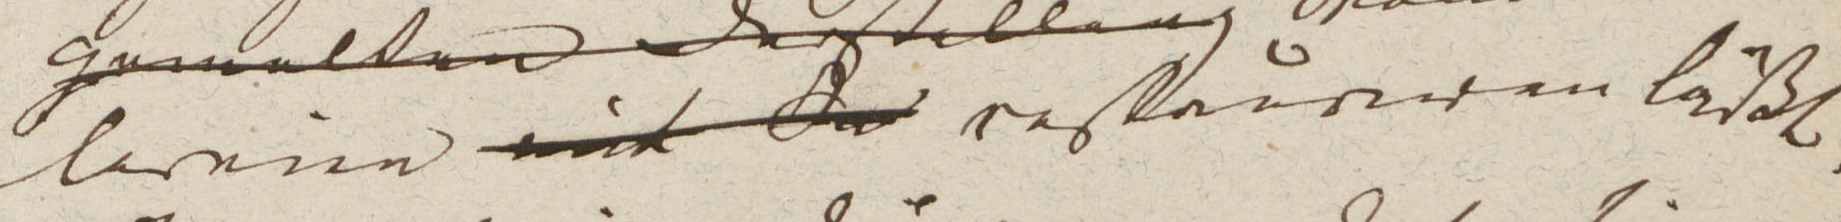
lereien mit S restauriren lässt.
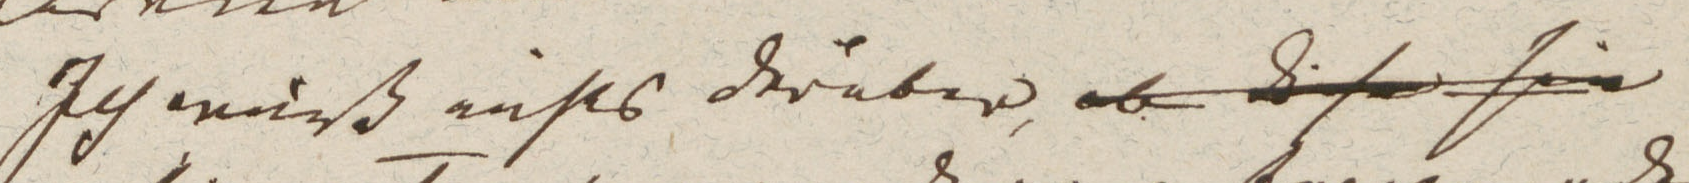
Ich weiss nichts darüber, ob diese sie
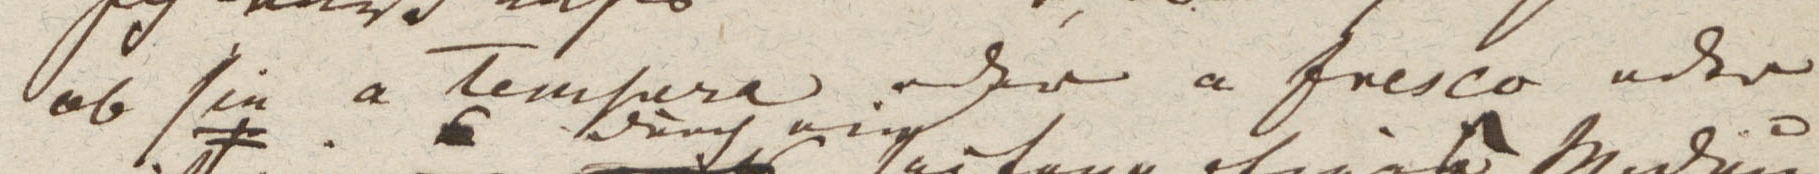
ob sie a tempera oder a fresco oder
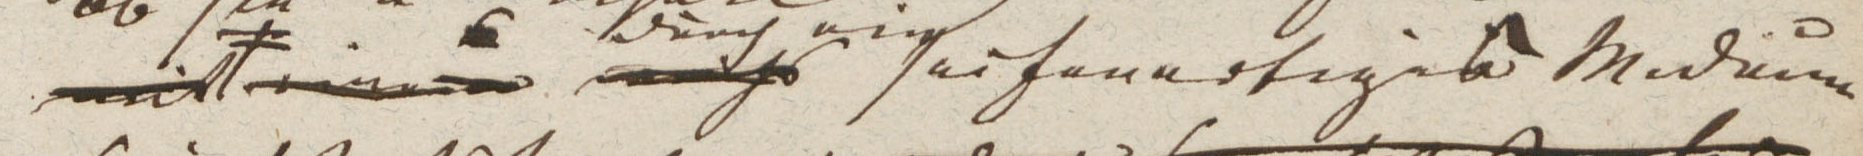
mit % eines wachs durch ein seifenartiges Medium
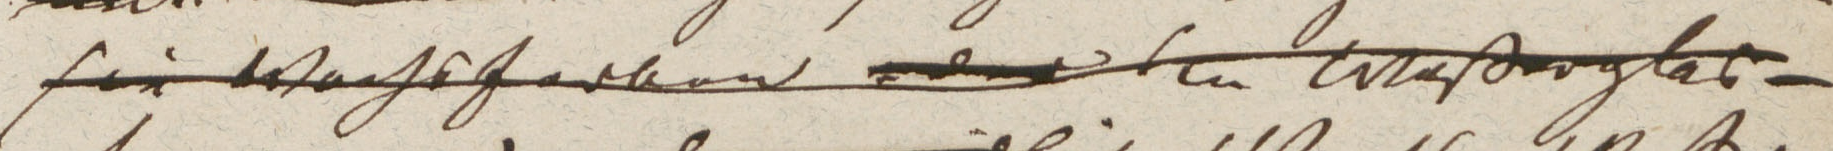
(in Wachsfarben oder (in Wasserglas-
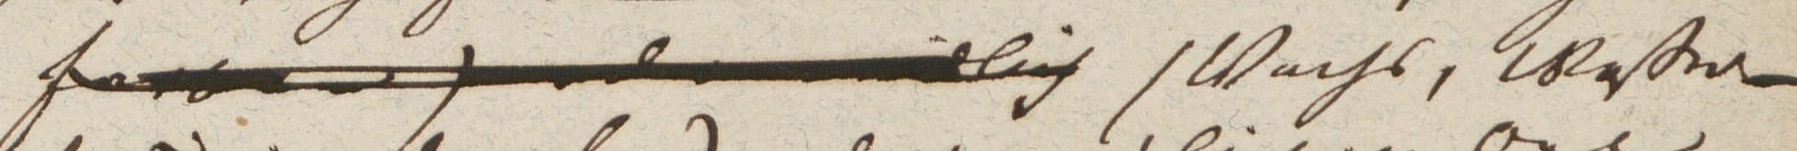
farben) oder lich (Wachs, Wasser-
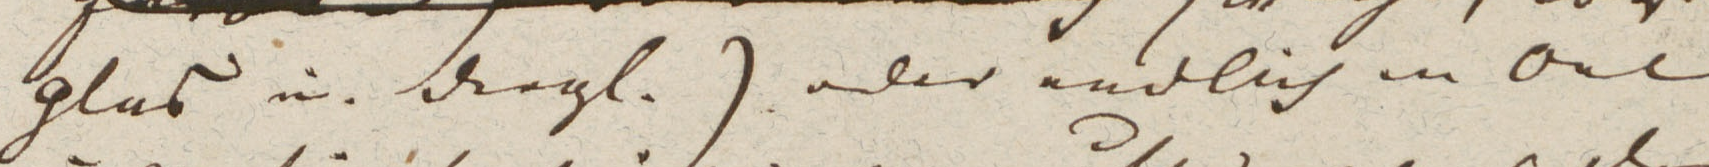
glas u. dergl.) oder endlich in Oel
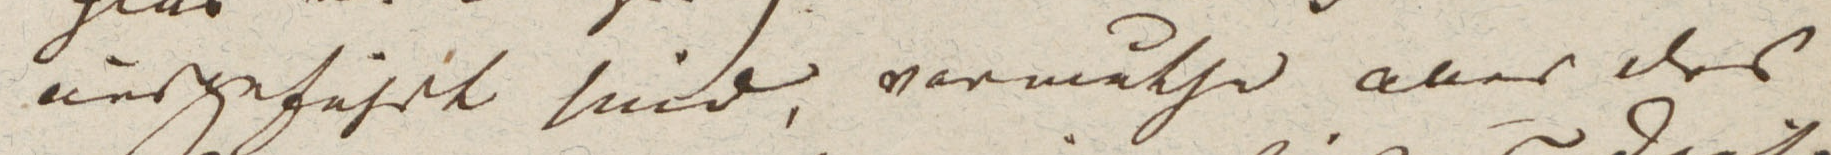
ausgeführt sind, vermuthe aber das
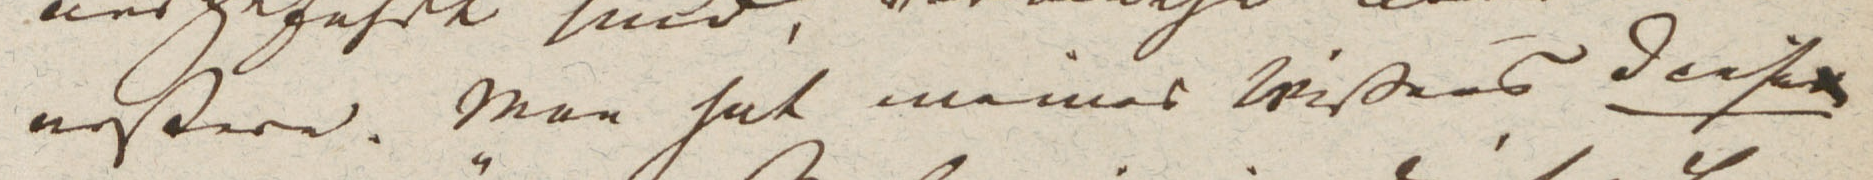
erstere. Man hat meines Wissens dieser
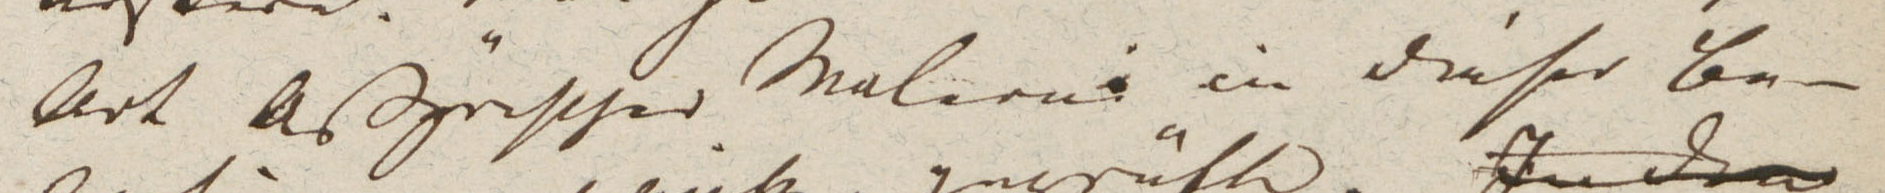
Art Assyrischer Malerei in dieser Be-
